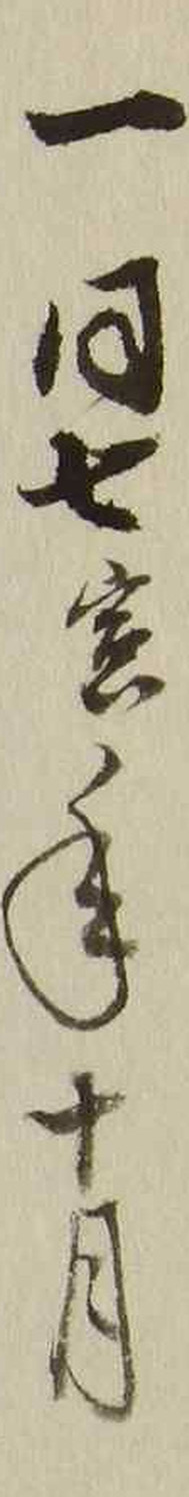一同七寅年十月
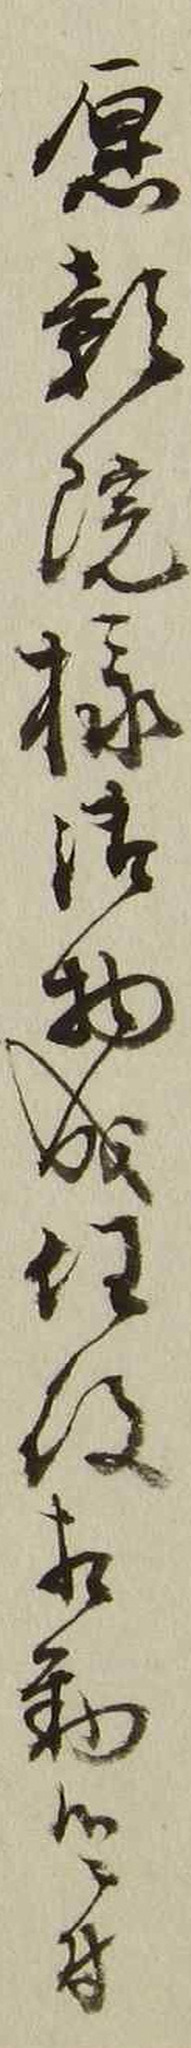愿彰院様御物成任役相勤候ニ付
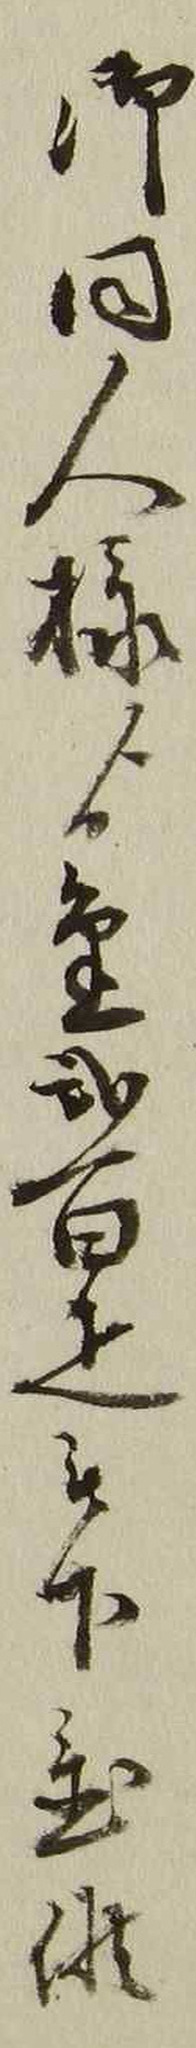御同人様ゟ金弐百疋被下置候
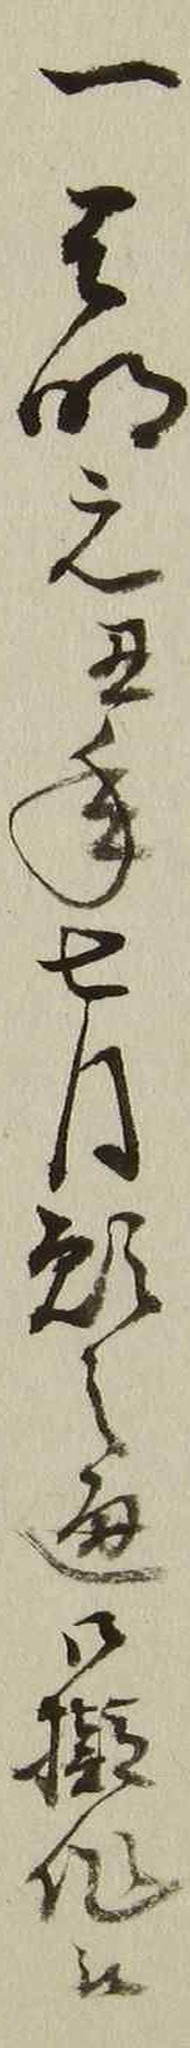一天明元丑年七月願之通御擬作被
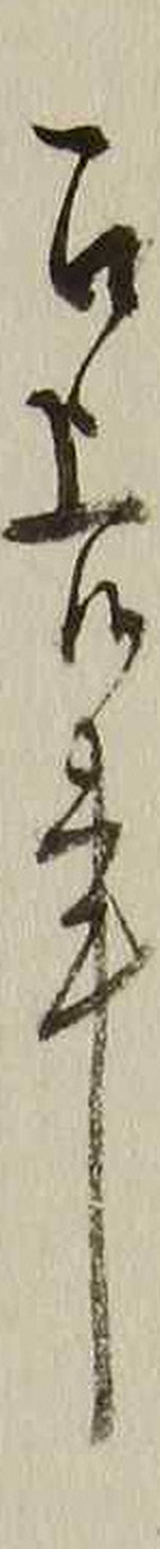召上候事
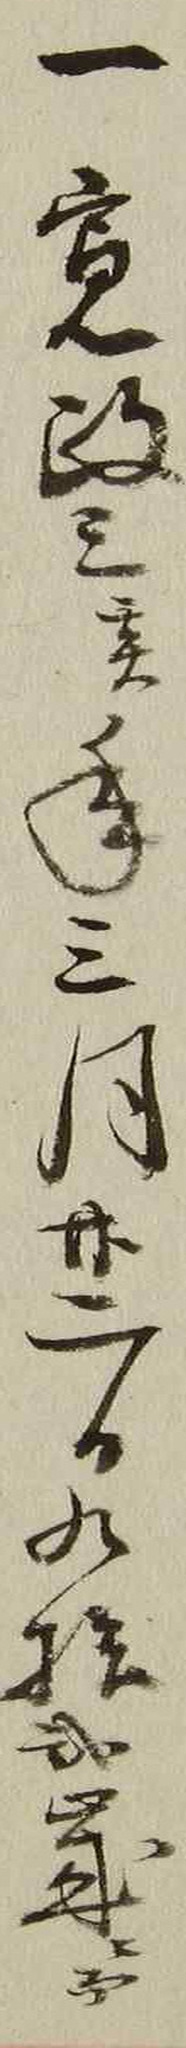一寛政三亥年三月廿二日九拾弐歳ニ而
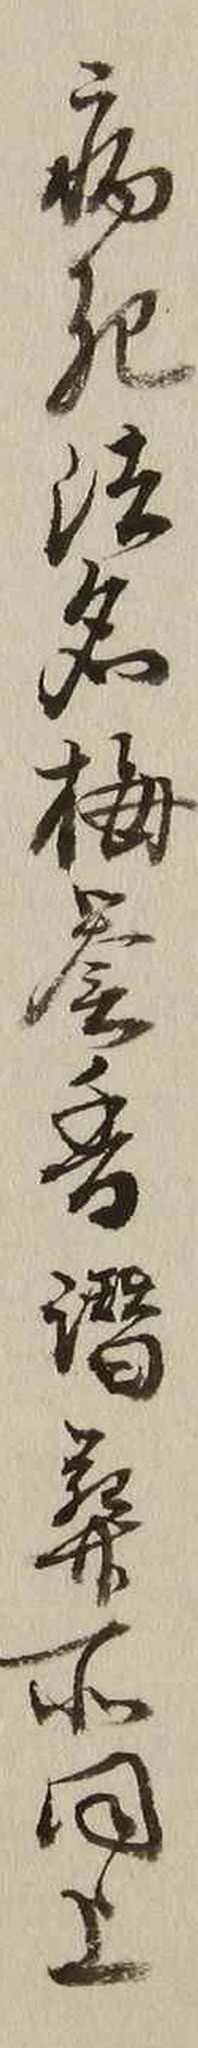病死法名梅誉香讃葬所同上
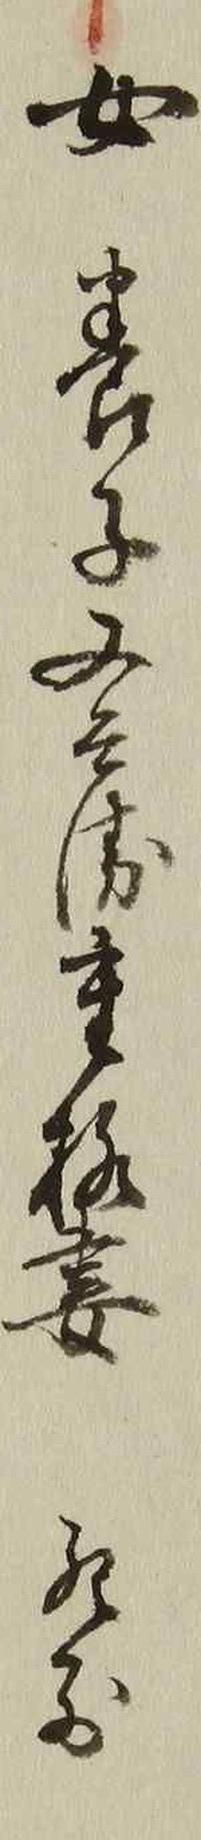女養子又兵衛重格妻死別
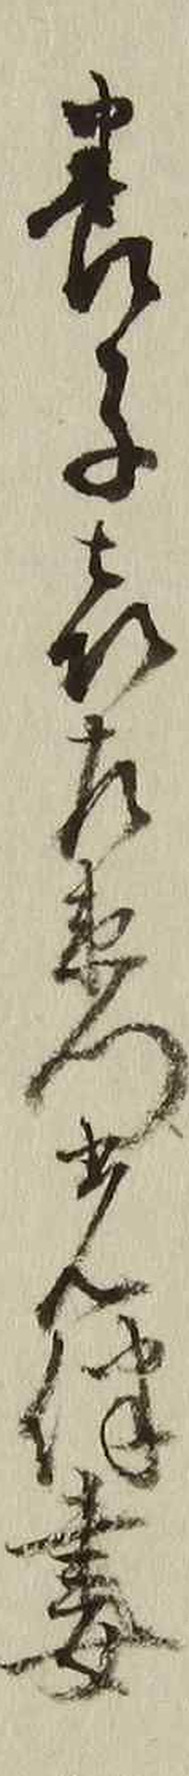養子喜左衛門光伴妻
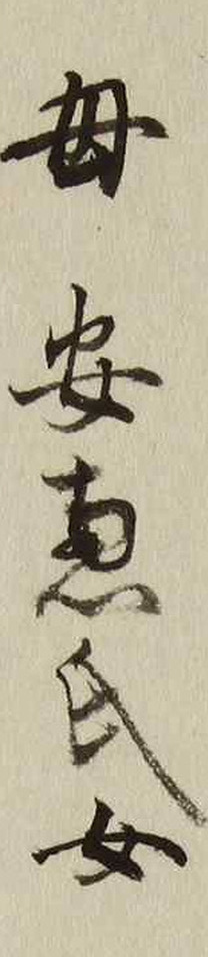母安恵氏女
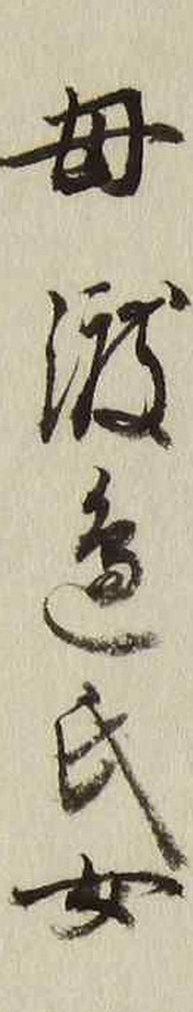母渡辺氏女

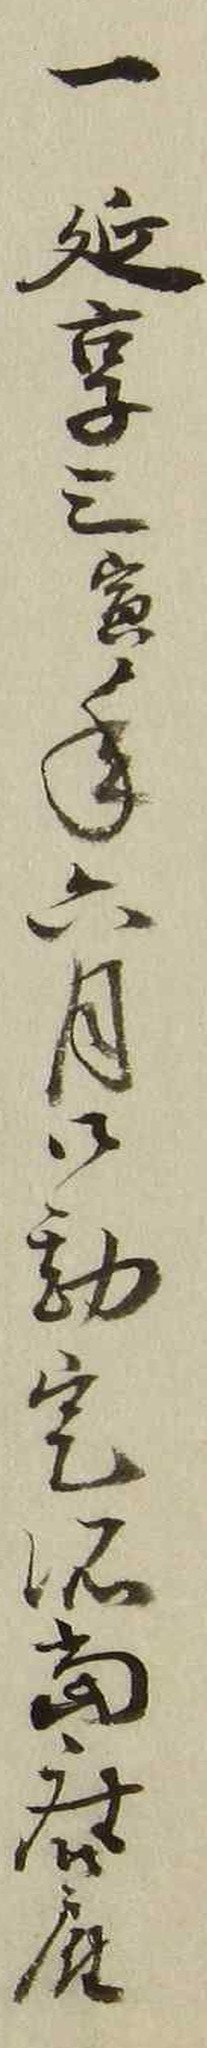一延享三寅年六月御勘定所当座御雇
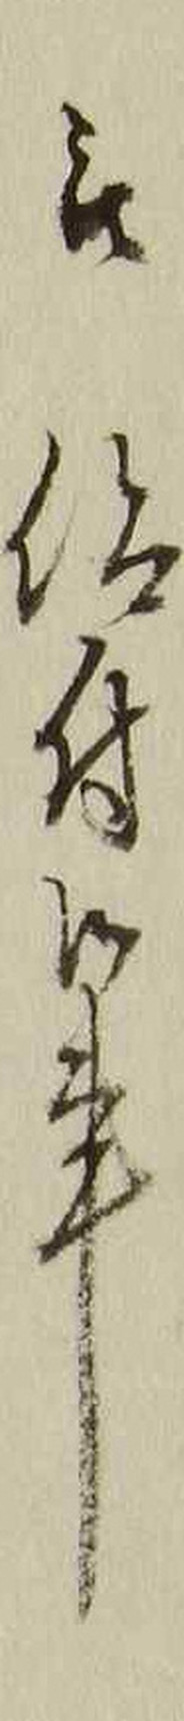被仰付候事
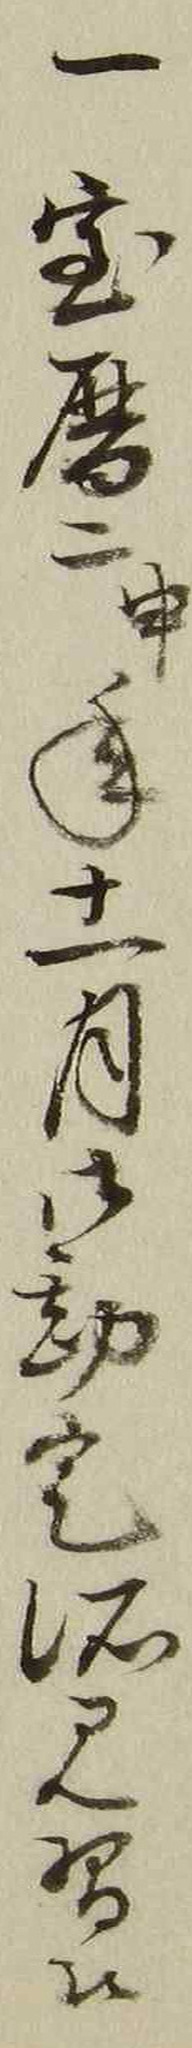一宝暦二申年十一月御勘定所見習被
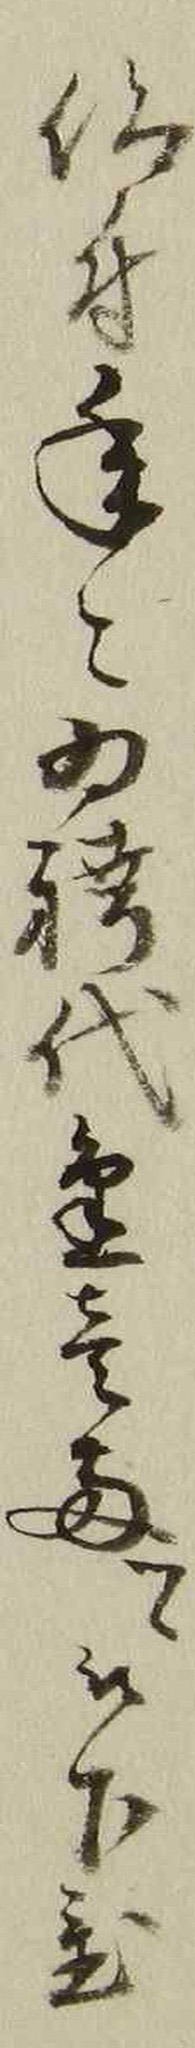仰付年々為袴代金壱両ツヽ被下置
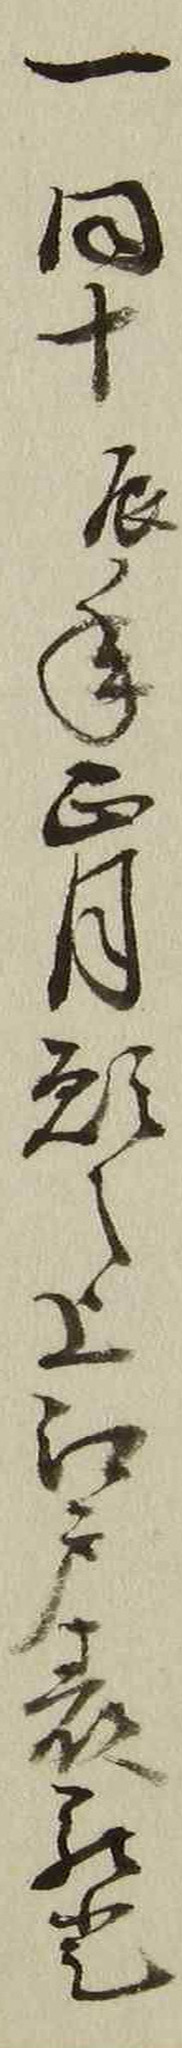一同十辰年正月願之上江戸表へ罷登
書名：諸士系譜　巻之36　は之部4
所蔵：会津若松市立会津図書館
